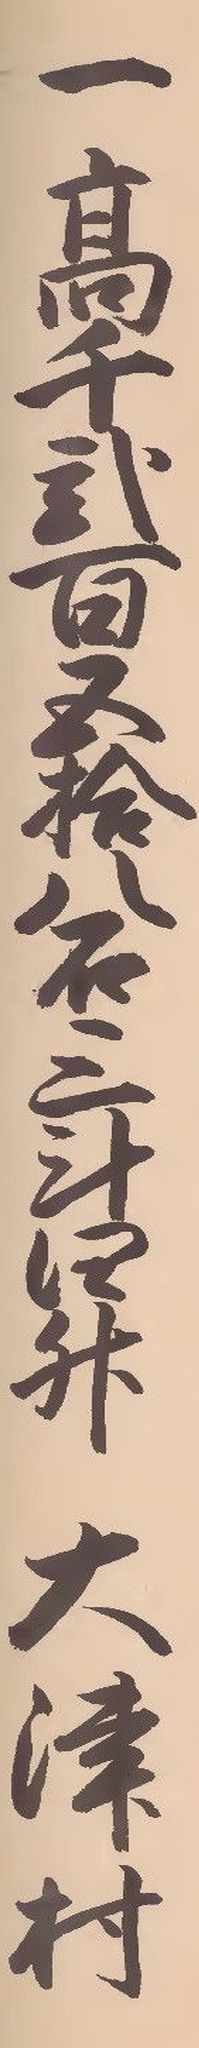一高千弐百五拾八石三斗四升大津村
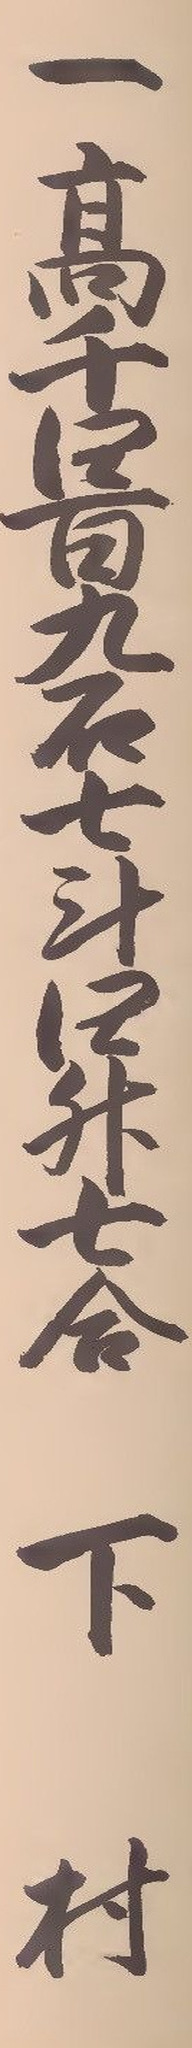一高千四百九石七斗四升七合下村
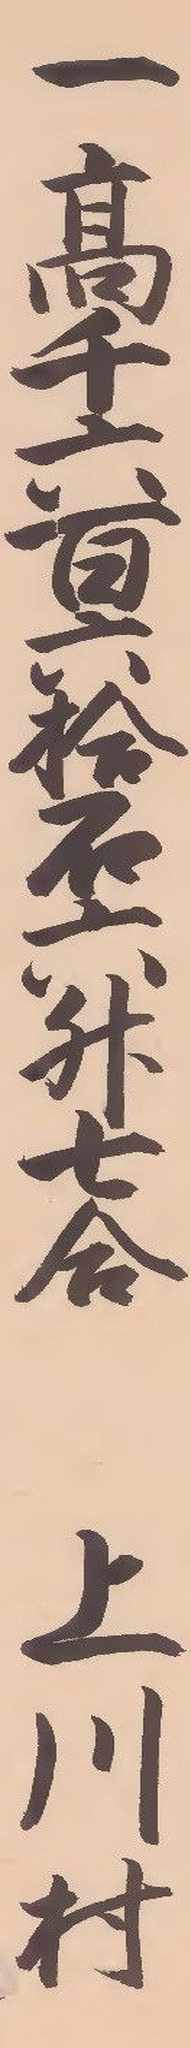一高千六百六拾石六升七合上川村
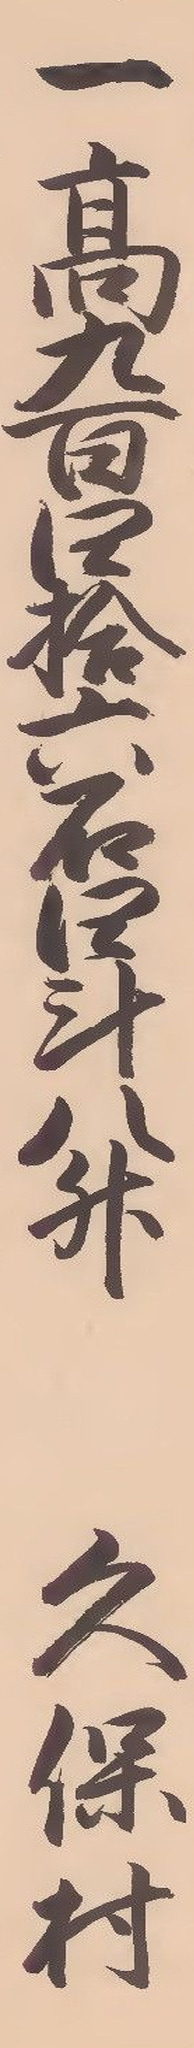一高九百四拾六石四斗八升久保村
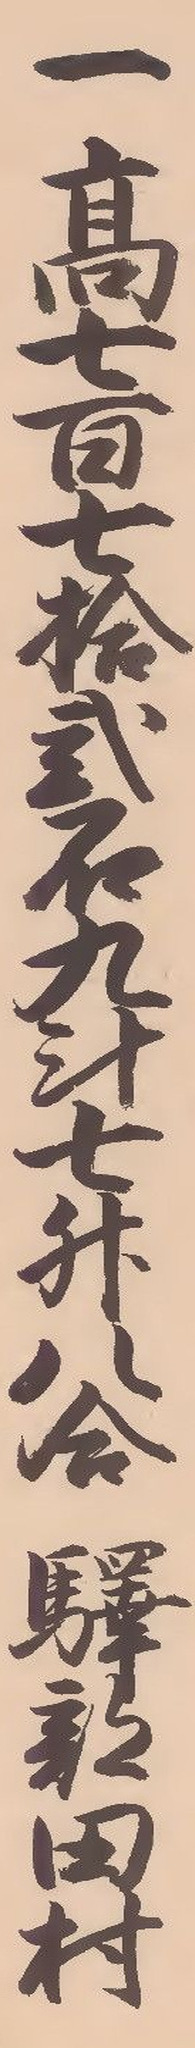一高七百七拾弐石九斗七升八合駅部田村

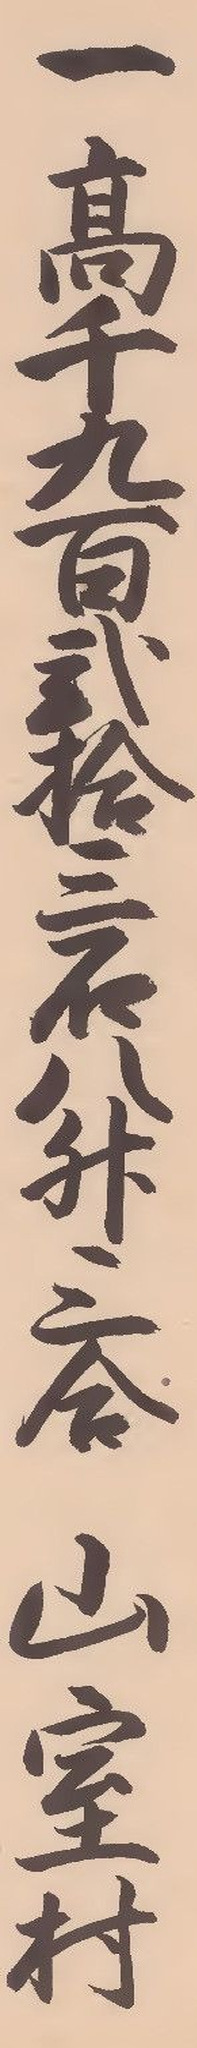一高千九百弐拾三石八升三合山室村
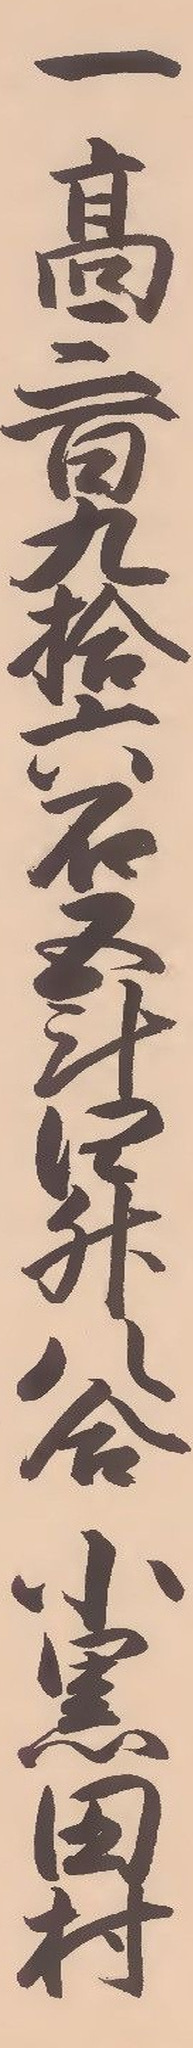一高三百九拾六石五斗四升八合小黒田村
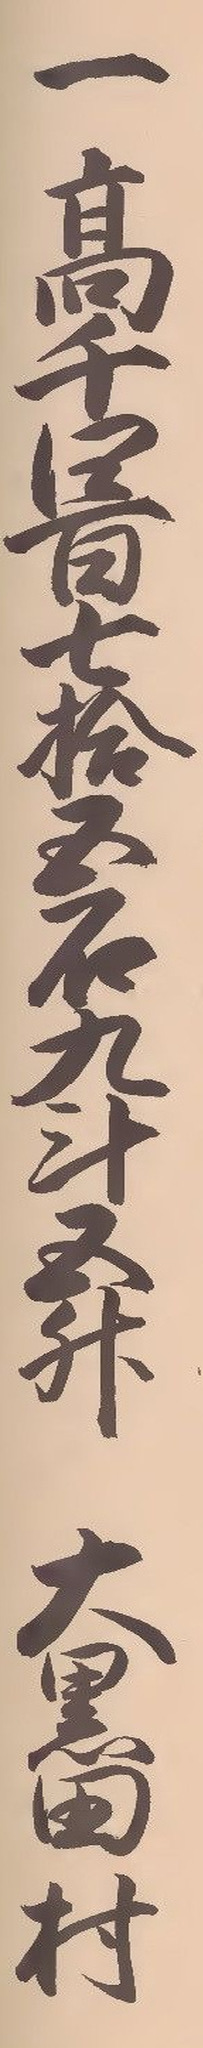一高千四百七拾五石九斗五升大黒田村
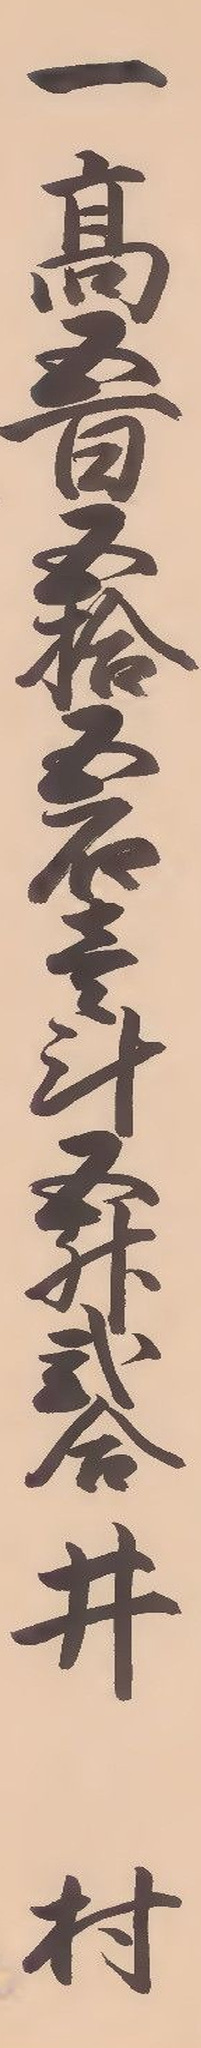一高五百五拾五石壱斗五升弐合井村
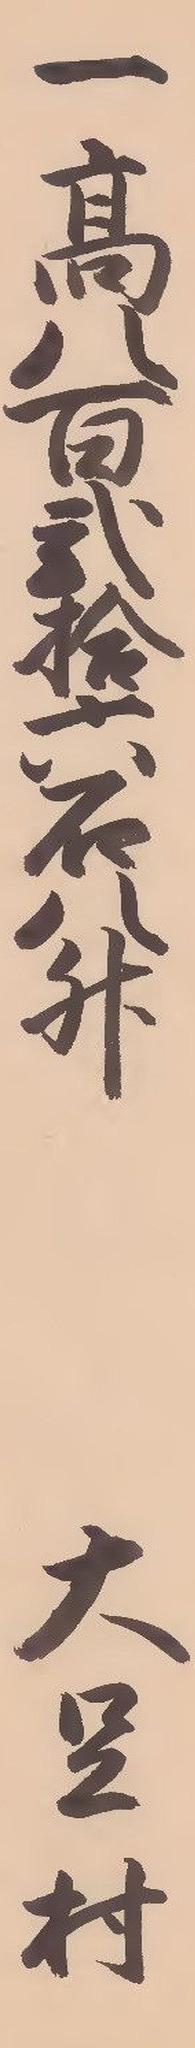一高八百弐拾六石八升大足村
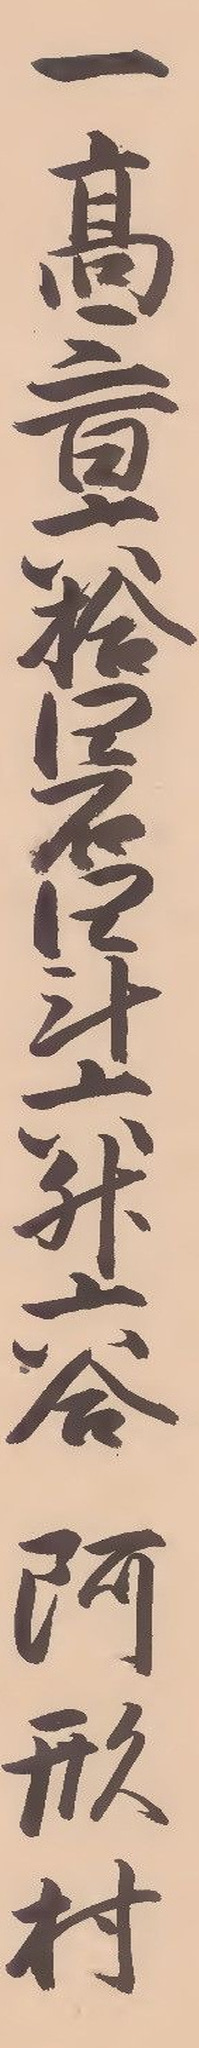一高三百六拾四石四斗六升六合阿形村

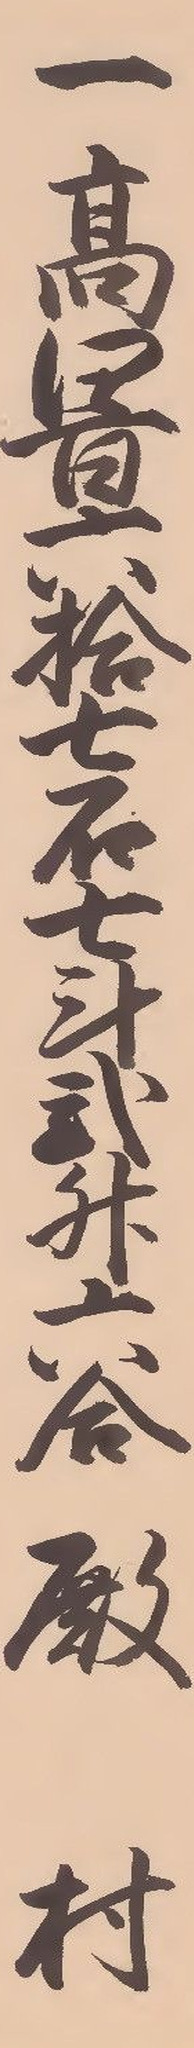一高四百六拾七石七斗弐升六合殿村
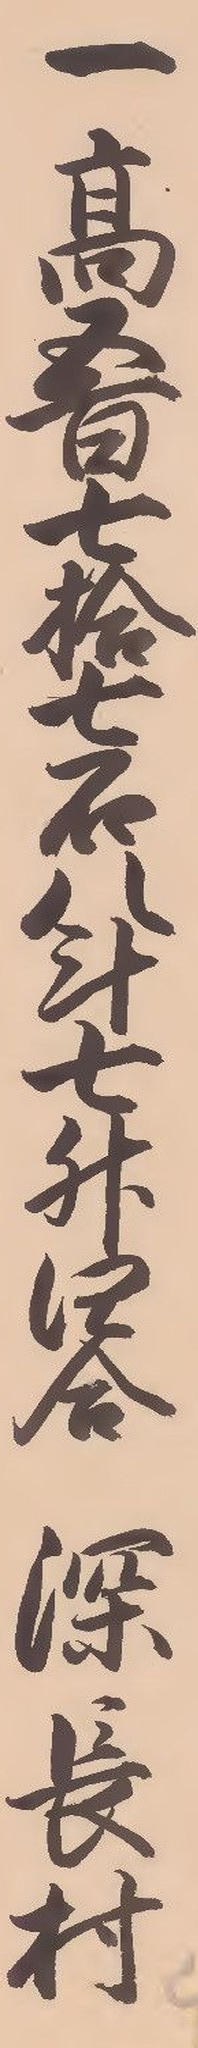一高五百七拾七石八斗七升四合深長村
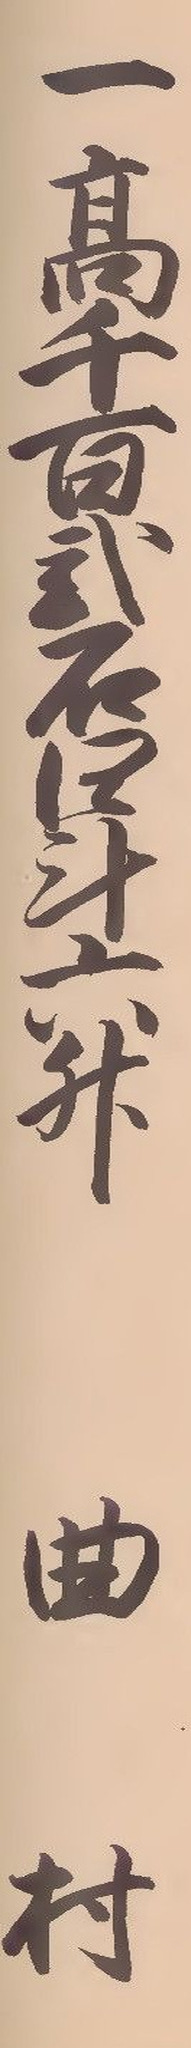一高千百弐石四斗六升曲村
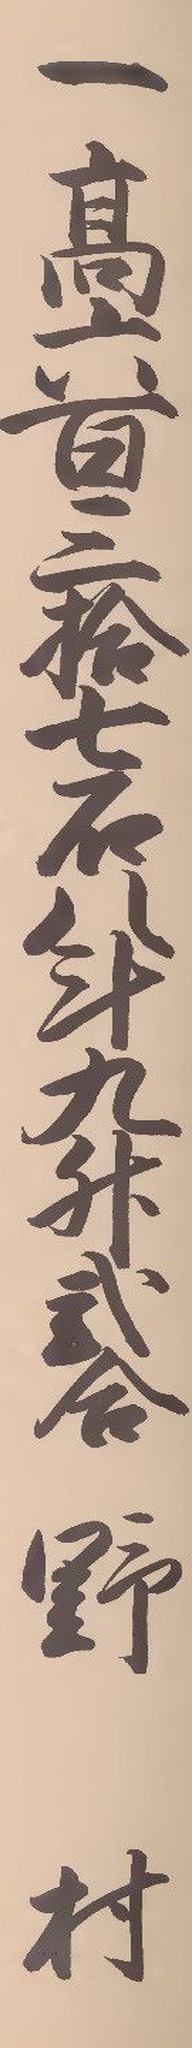一高六百三拾七石八斗九升弐合野村
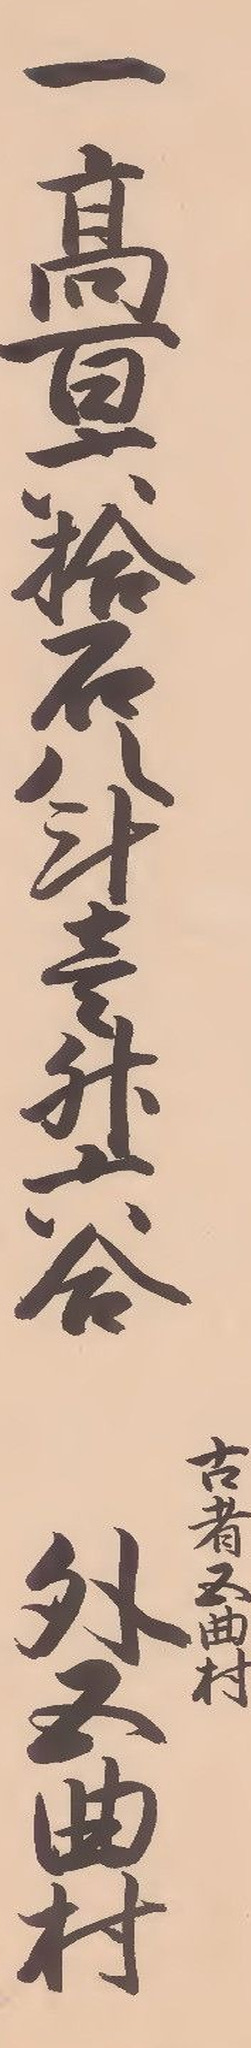一高四百六拾七石七斗弐升六合殿村
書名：伊勢国郷帳
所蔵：国立公文書館 National Archives of Japan
